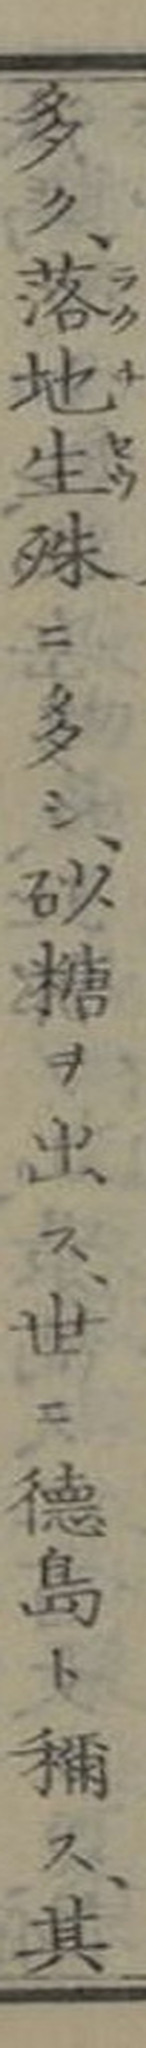多ク、落地生殊ニ多シ、砂糖ヲ出ス、世ニ徳島ト称ス、其
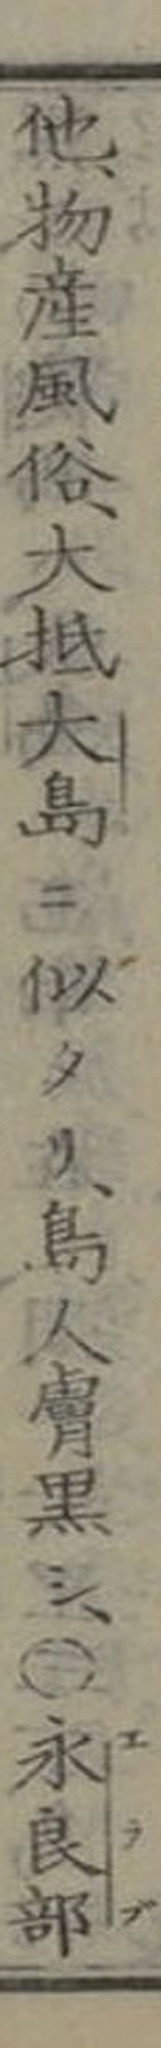他、物産風俗、大抵大島ニ似タリ、島人膚黒シ、○永良部
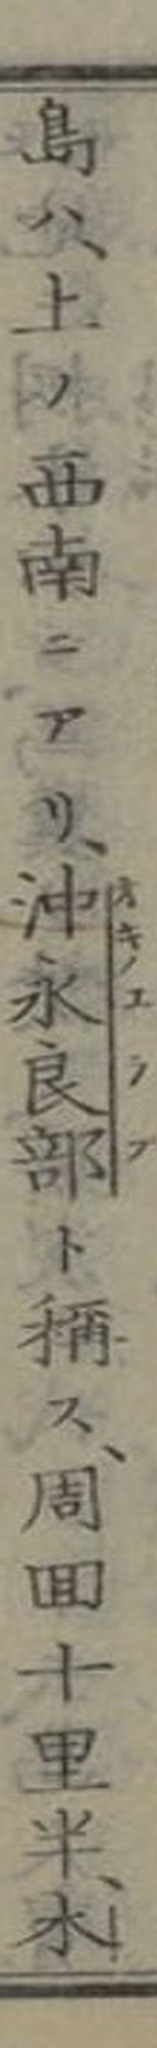島ハ、上ノ西南ニアリ、沖永良部ト称ス、周回十里半、木
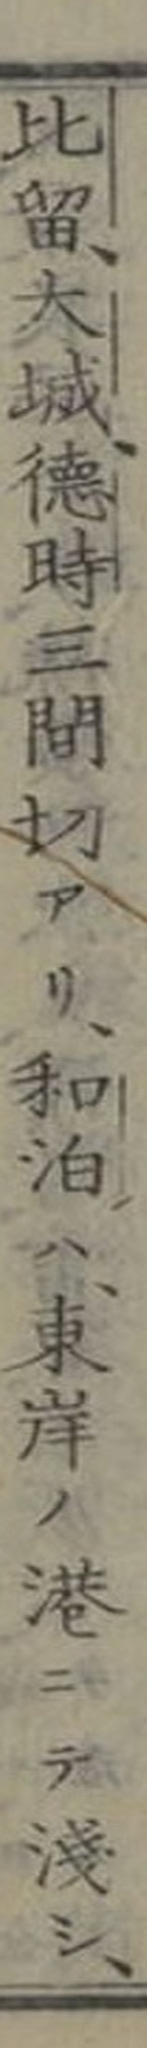比留、大城、徳時三間切アリ、和泊ハ、東岸ノ港ニテ浅シ、
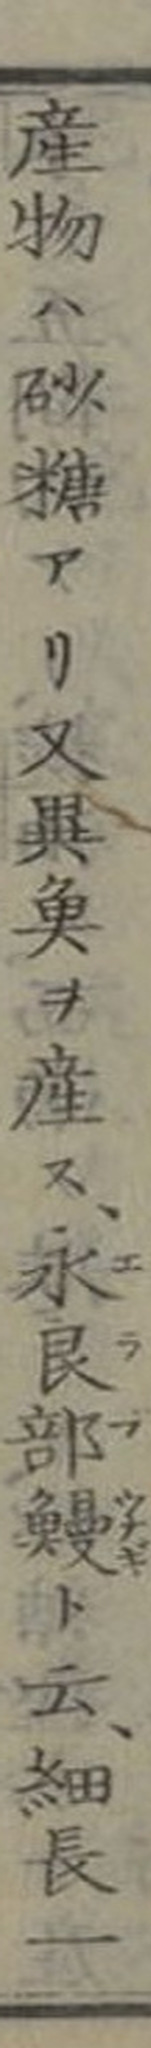産物ハ砂糖アリ又異魚ヲ産ス、永良部鰻ト云、細長一
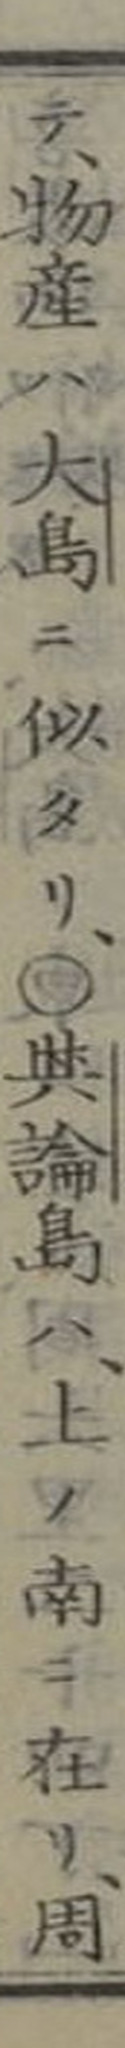テ、物産ハ大島ニ似タリ、○与論島ハ、上ノ南ニ在リ、周
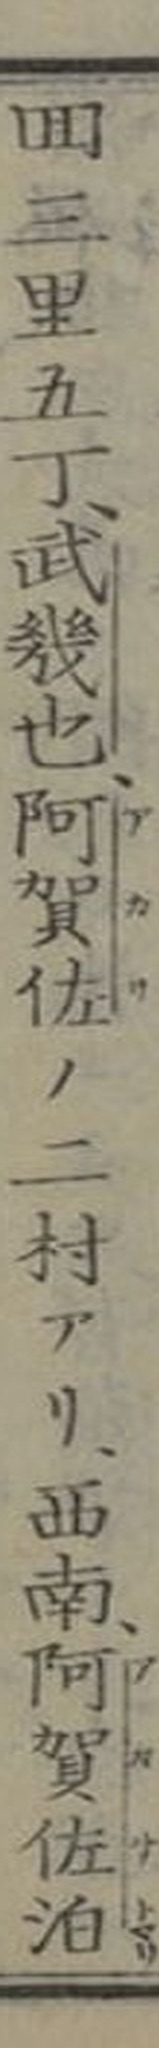回三里五丁、武幾也、阿賀佐ノ二村アリ、西南、阿賀佐泊
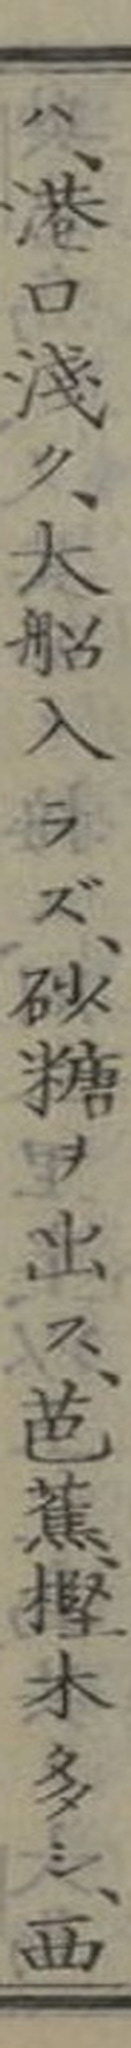ハ、港口浅ク、大船入ラズ、砂糖ヲ出ス、芭蕉、樫木多シ、西
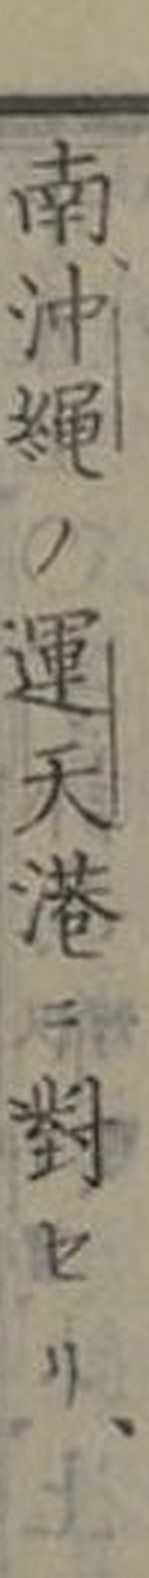南、沖縄ノ運天港ニ対セリ、
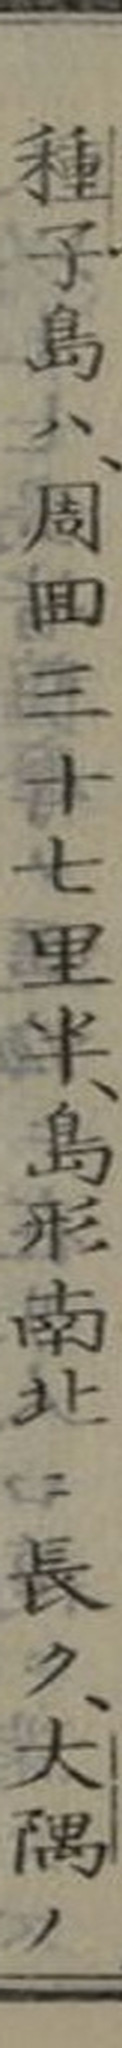種子島ハ、周回三十七里半、島形南北ニ長ク、大隅ノ
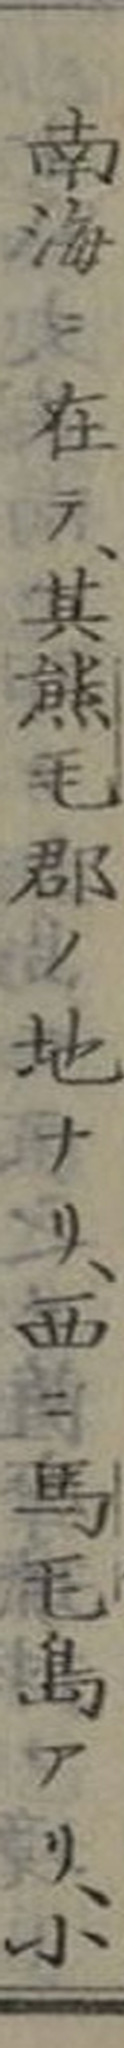南海ニ在テ、其熊毛郡ノ地ナリ、西ニ馬毛島アリ、小
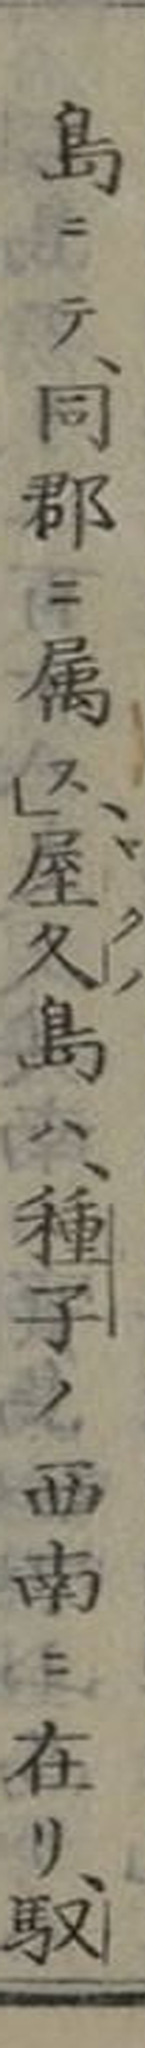島ニテ、同郡ニ属ス、」屋久島ハ、種子ノ西南ニ在リ、馭
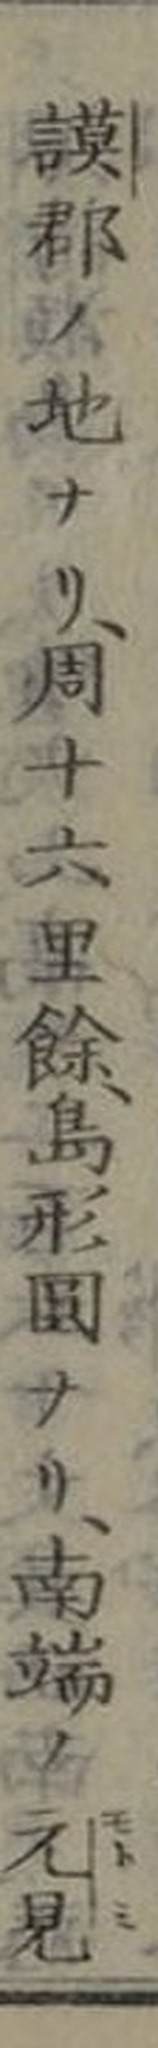謨郡ノ地ナリ、周十六里余、島形円ナリ、南端ノ元見
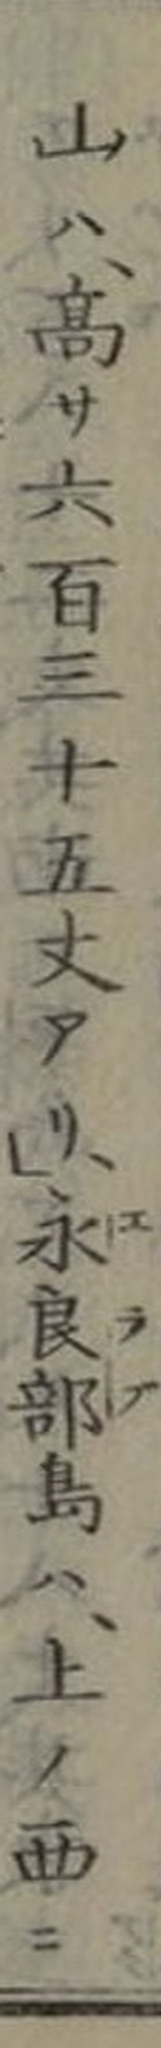山ハ、高サ六百三十五丈アリ、」永良部島ハ、上ノ西ニ
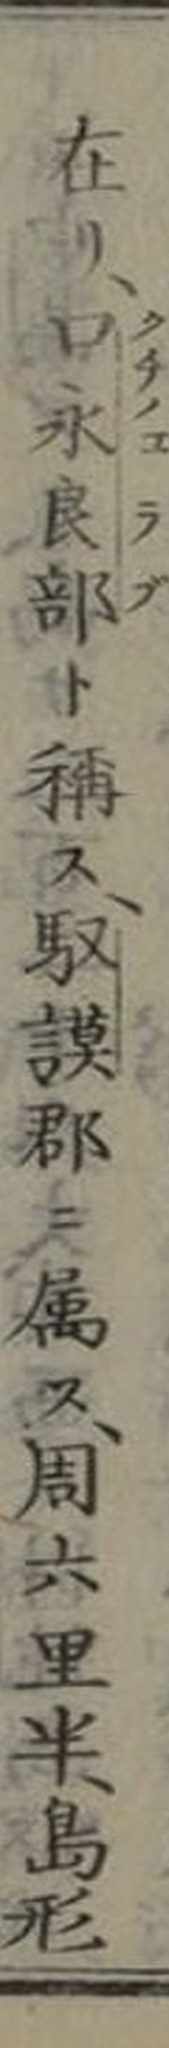在リ、口永良部ト称ス、馭謨郡ニ属ス、周六里半、島形
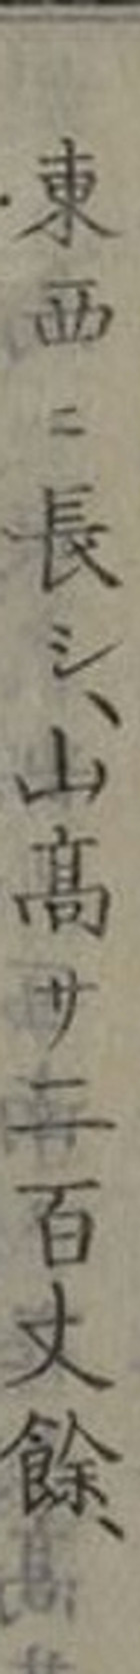東西ニ長シ、山高サ二百丈余、
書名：琉球新誌 図附 上
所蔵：University of the Ryukyus Library
